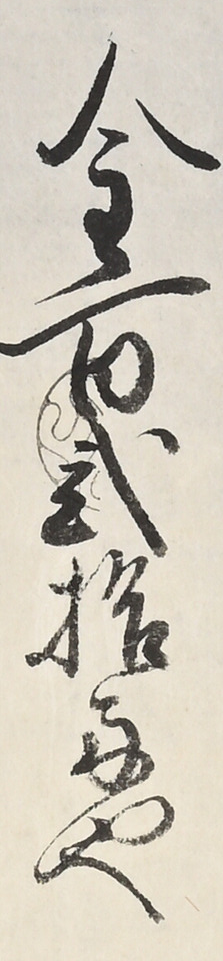金百弐拾両也
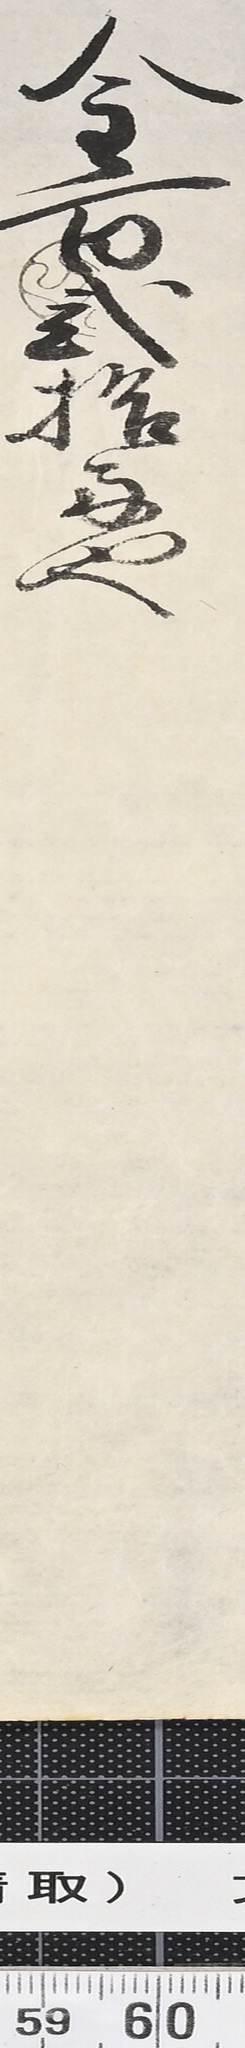金百弐拾両也
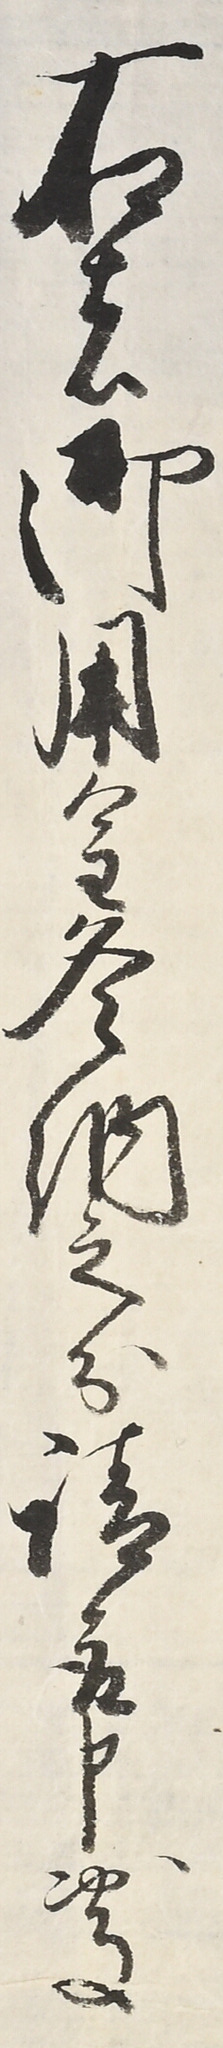右者御用金冬納之分請取申処
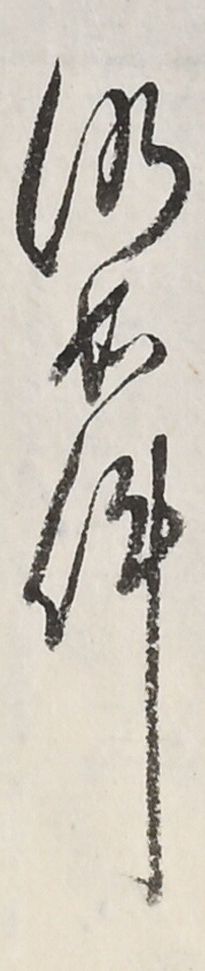仍如件
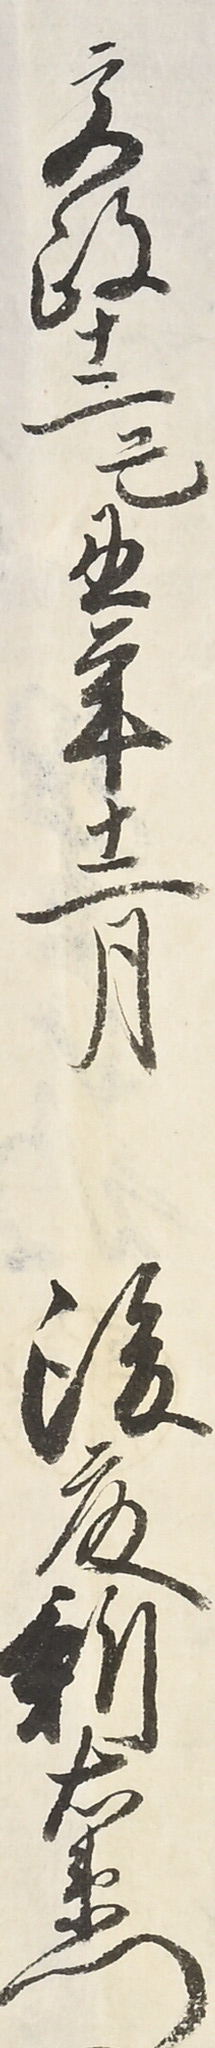文政十二己丑年十二月後藤新右衛門㊞
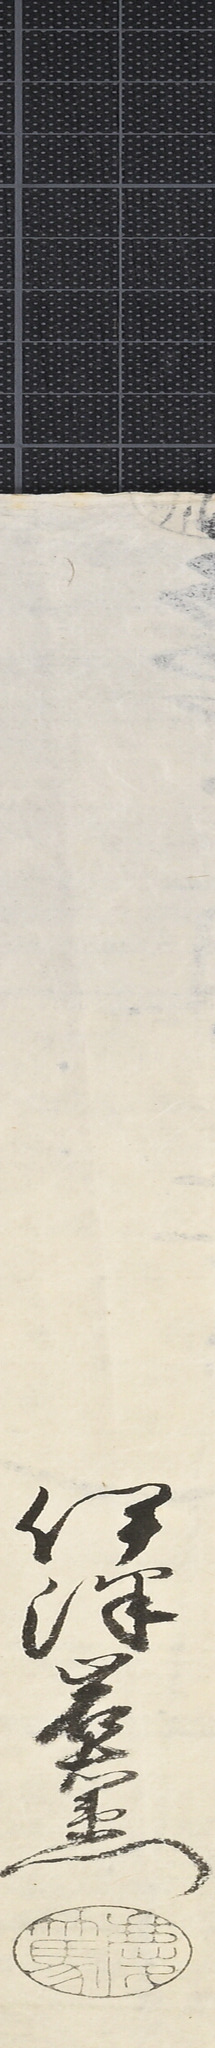伊澤岩右衛門㊞
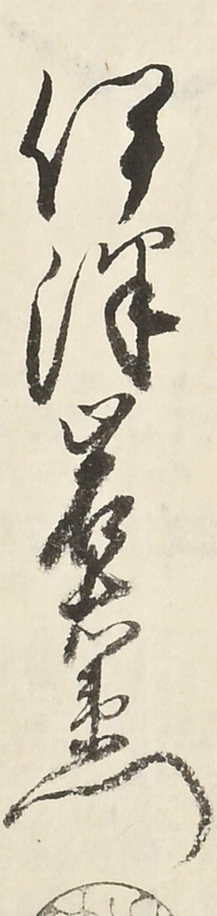伊澤岩右衛門㊞
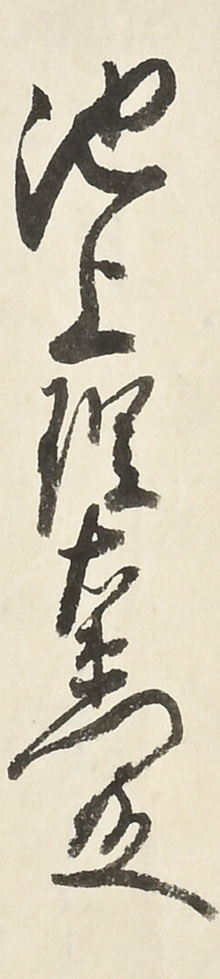池上理右衛門殿
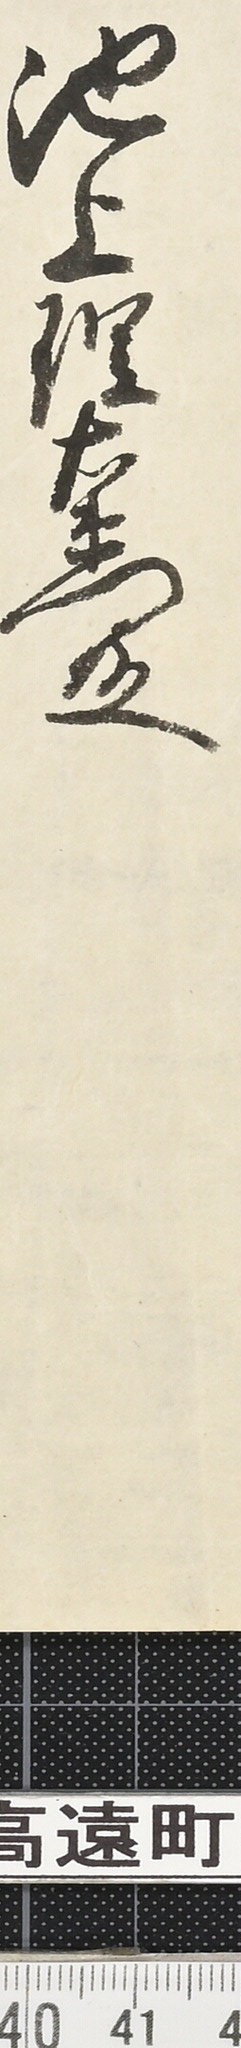池上理右衛門殿
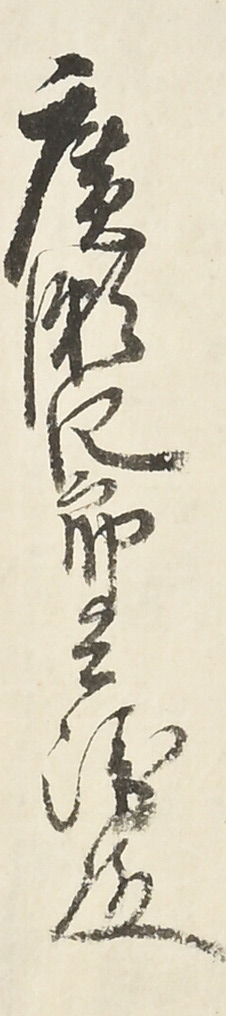広瀬四郎兵衛殿
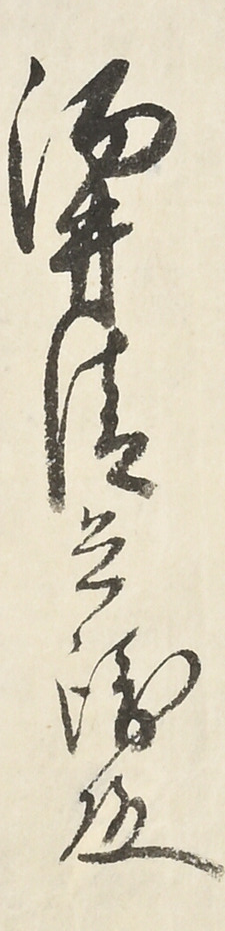酒井清兵衛殿

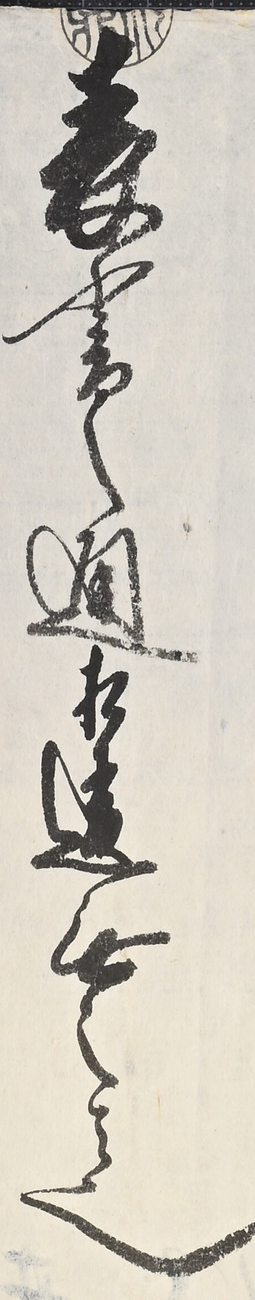㊞表書之通相違無之者也

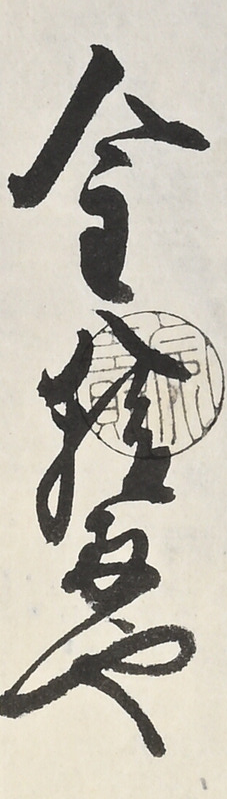金八拾両也
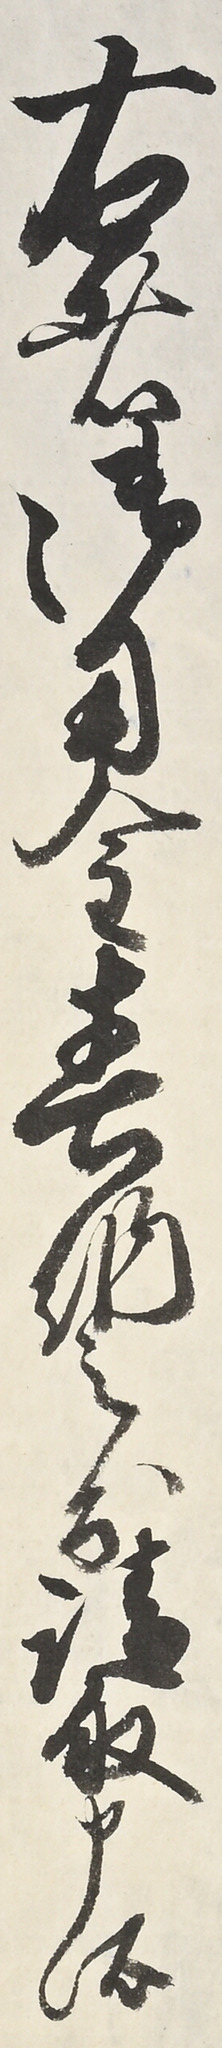右者御用金春納之分請取申所
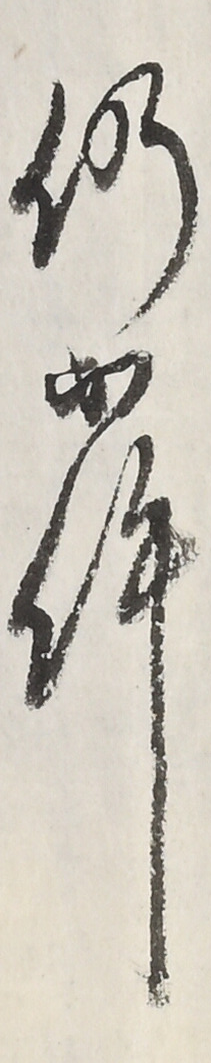仍如件
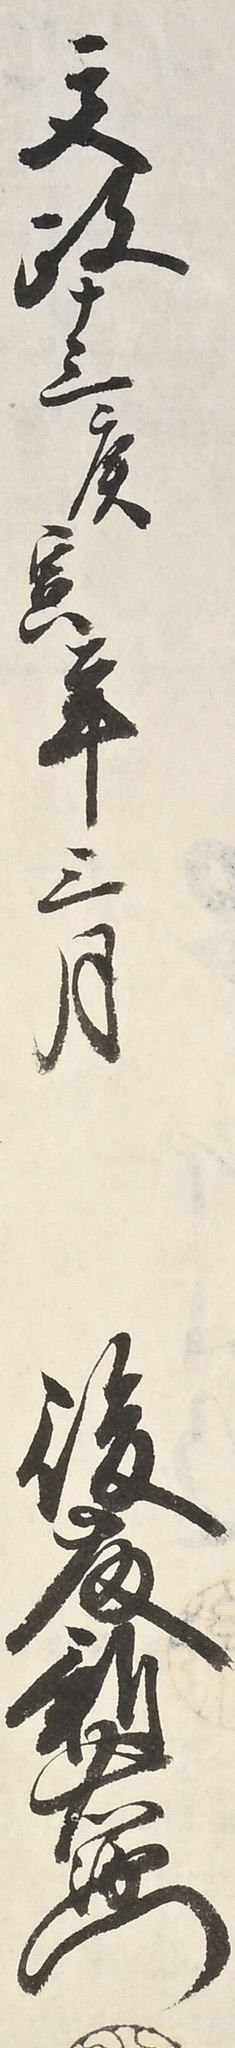文政十三庚寅年三月後藤新右衛門㊞
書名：覚
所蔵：伊那市立高遠町図書館・合同会社AMANE
